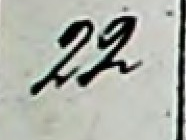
22
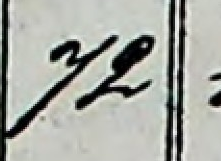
72
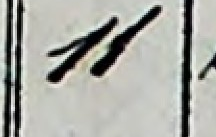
11
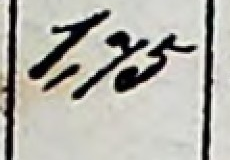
1,75
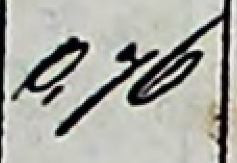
0,76
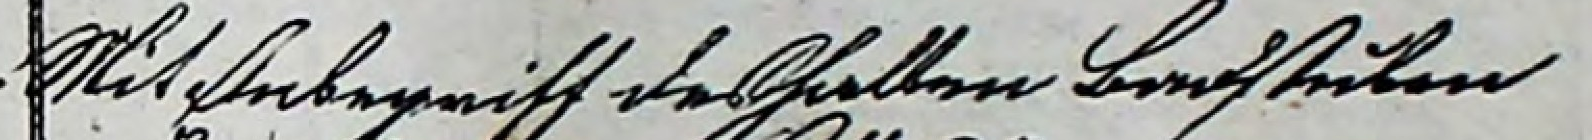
Mit Inbegriff deshalten Badstuben
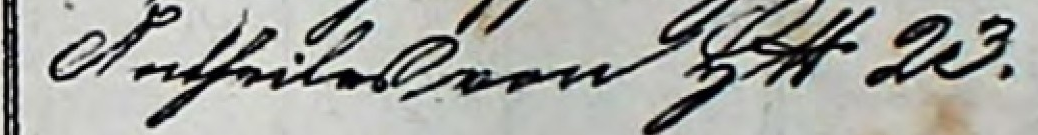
Antheiles von Hn 23.
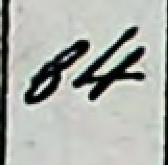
84
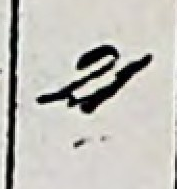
21
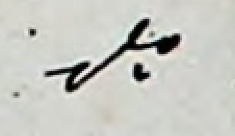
do
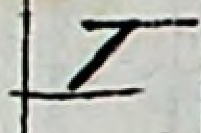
I
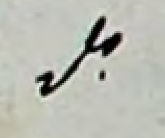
do
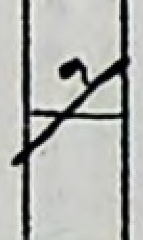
7
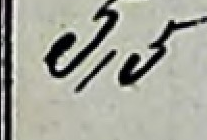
5,5
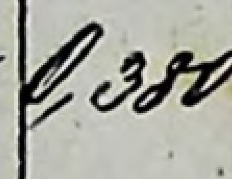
0,380
